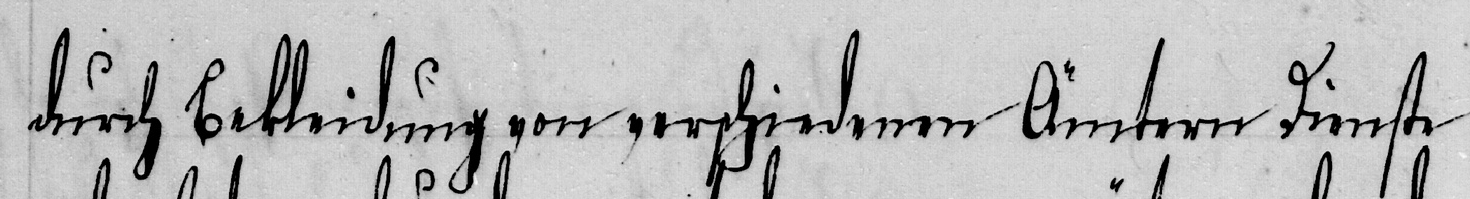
durch Bekleidung von verschiedenen Ämtern Dienste
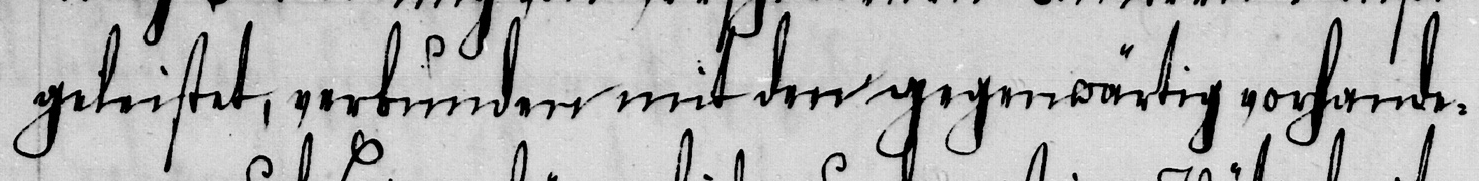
geleistet, verbunden mit den gegenwärtig vorhande¬
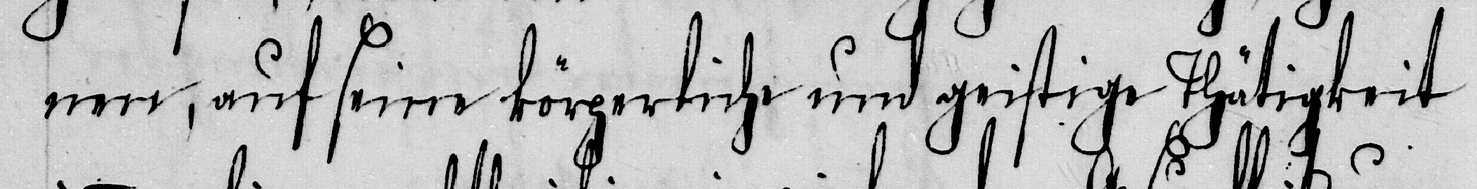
nen, auf seine körperliche und geistige Thätigkeit
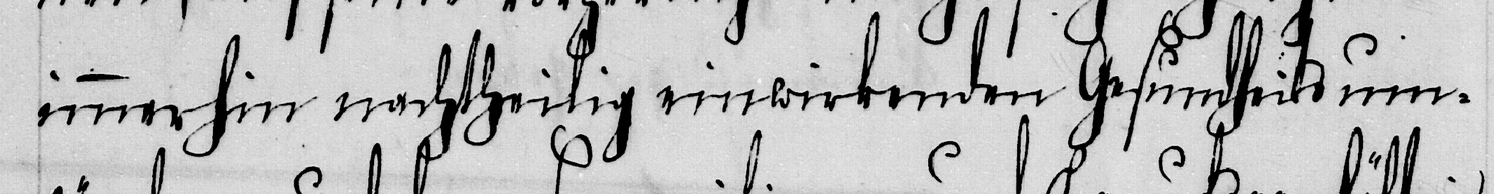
immerhin nachtheilig einwirkenden Gesundheitsum¬
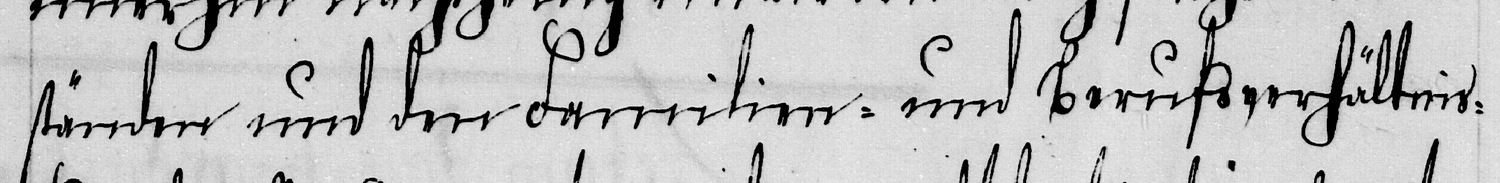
ständen und den Familien- und Berufsverhältnis¬
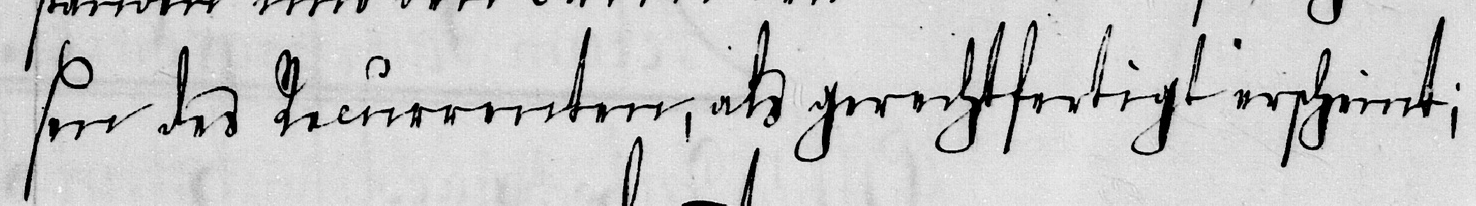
sen des Recurrenten, als gerechtfertigt erscheint;
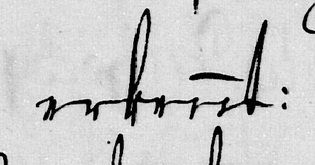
erkennt:
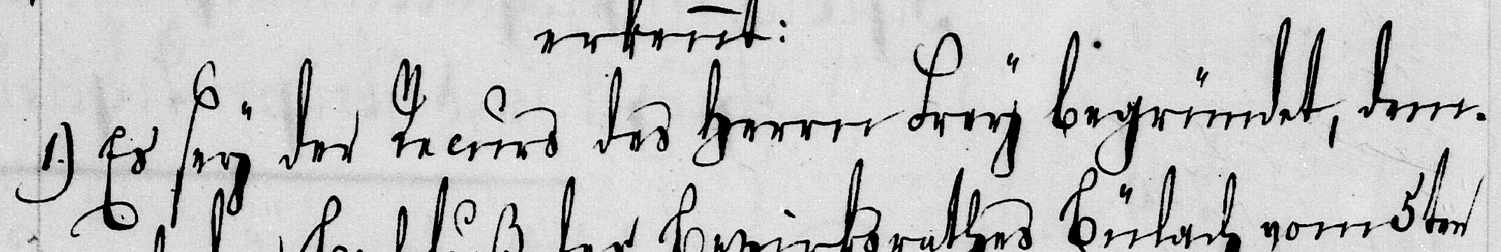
Es sey der Recurs des Herrn Frey begründet, dem¬
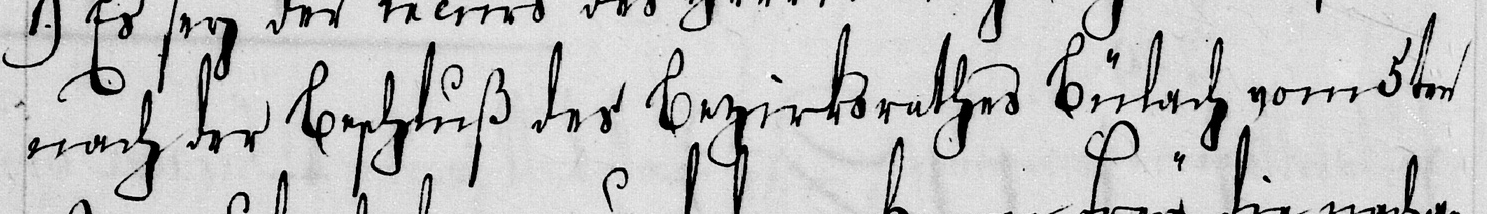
nach der Beschluß des Bezirksrathes Bülach vom 5ten
